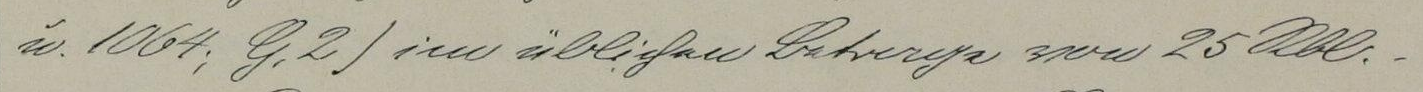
u. 1064; G.2) im üblichen Betrage von 25 Rbl.
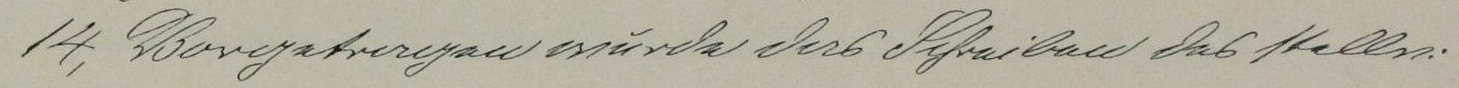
14. Vorgetragen wurde das Schreiben des stellv.
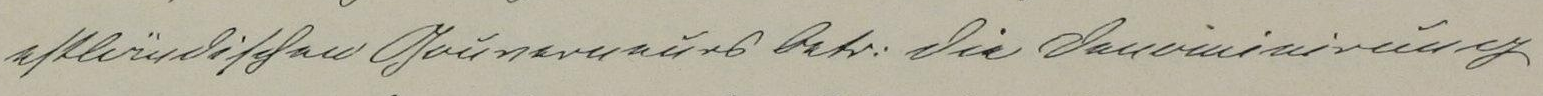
estländischen Gouverneurs betr. die Denominierung
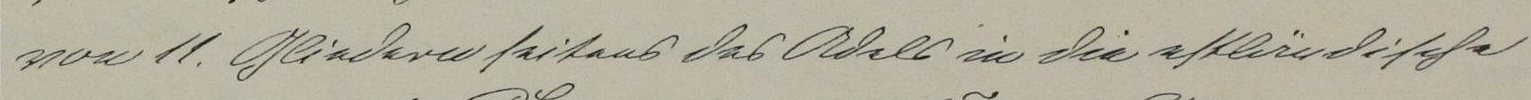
von 11. Gliedern seitens des Adels in die estländische
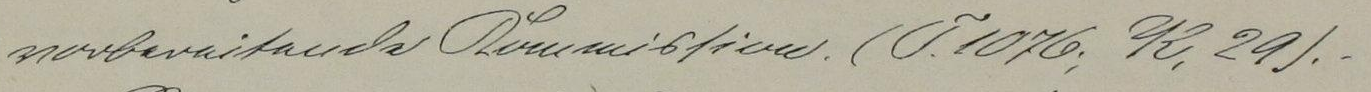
vorbereitende Kommission (T.1076; K.29).
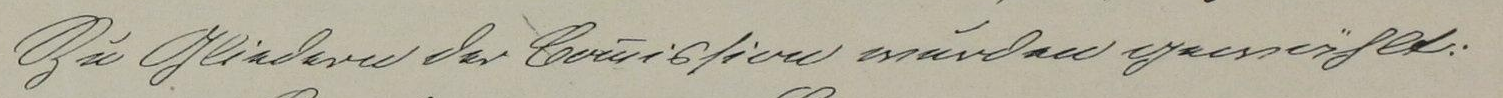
Zu Gliedern der Commission wurden gewählt:
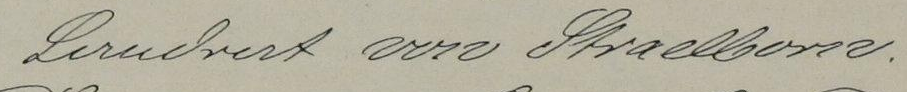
Landrat von Straelborn
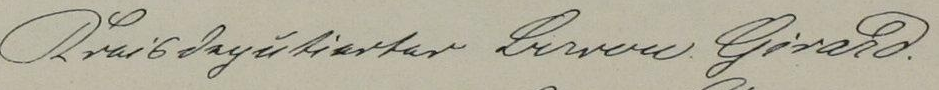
Kreisdeputierter Baron Girard
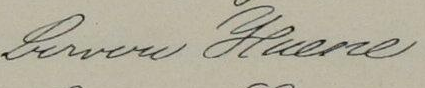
Baron Huene
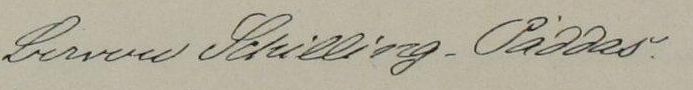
Baron Schilling-Paddas
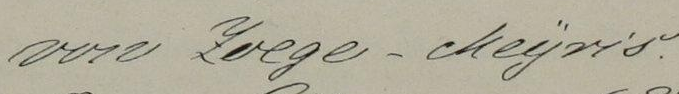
von Zoege-Meyris
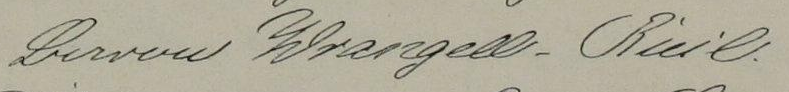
Baron Wrangell-Ruil
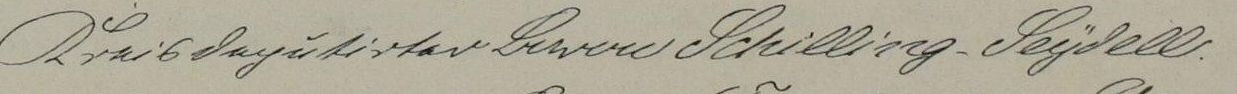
Kreisdeputierter Baron Schilling-Seydell
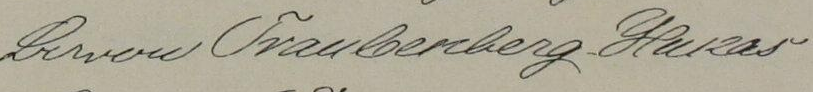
Baron Traubenberg-Hukas
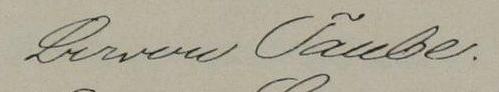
Baron Taube
